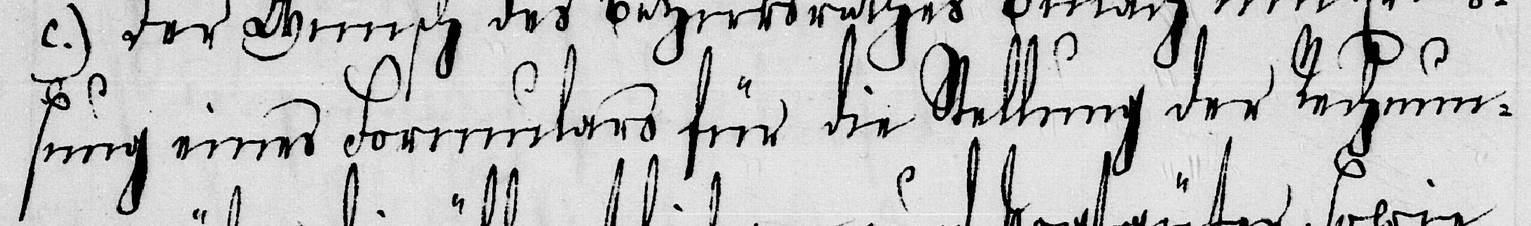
ung eines Formulars für die Stellung der Rechnun¬
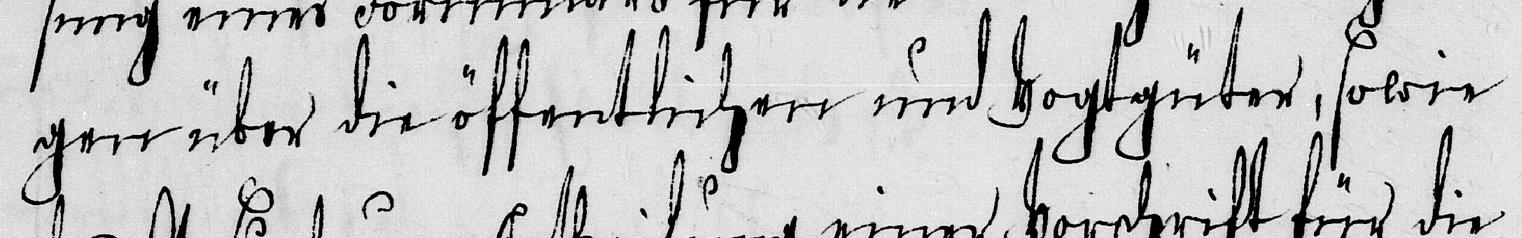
gen über die öffentlichen und Vogtgüter, sowie
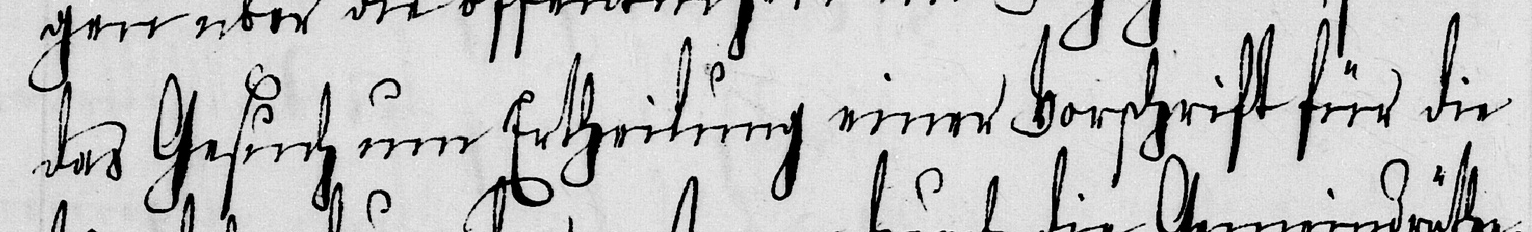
das Gesuch um Ertheilung einer Vorschrift für die
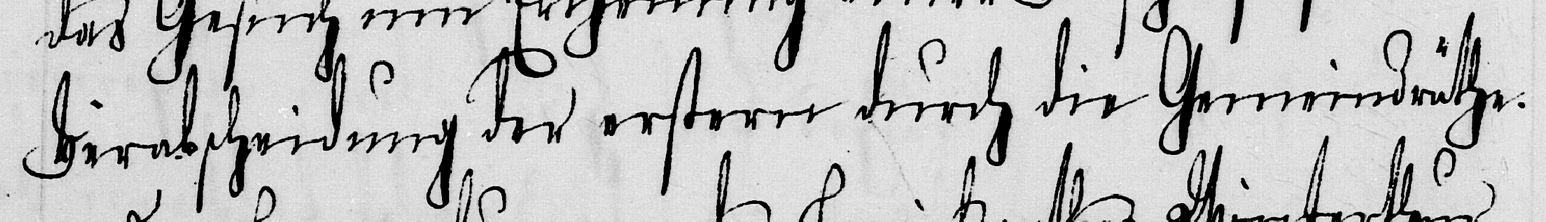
Verabscheidung der erstern durch die Gemendräthe.
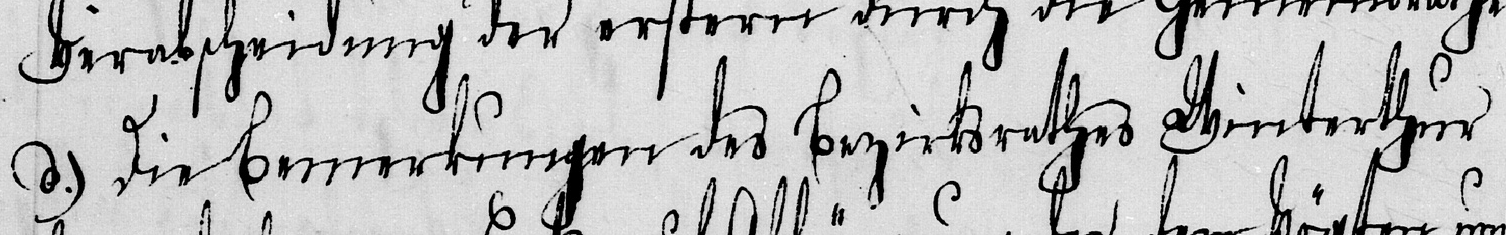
d.) Die Bemerkungen des Bezirksrathes Winterthur
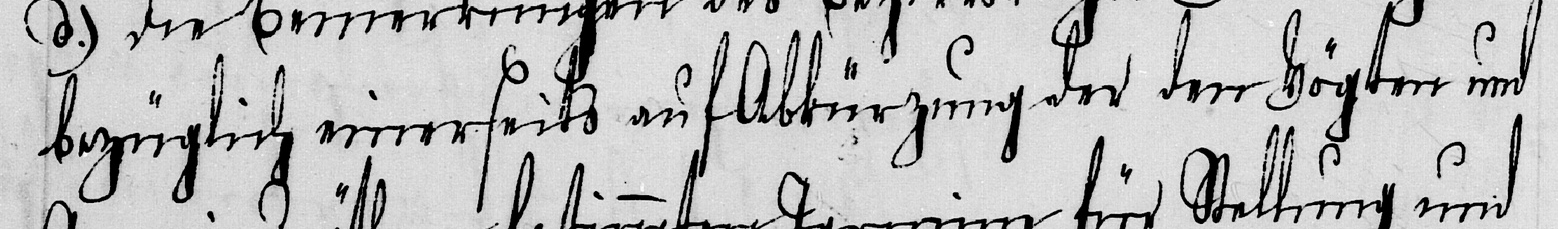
bezüglich einerseits auf Abkürzung der den Vögten und
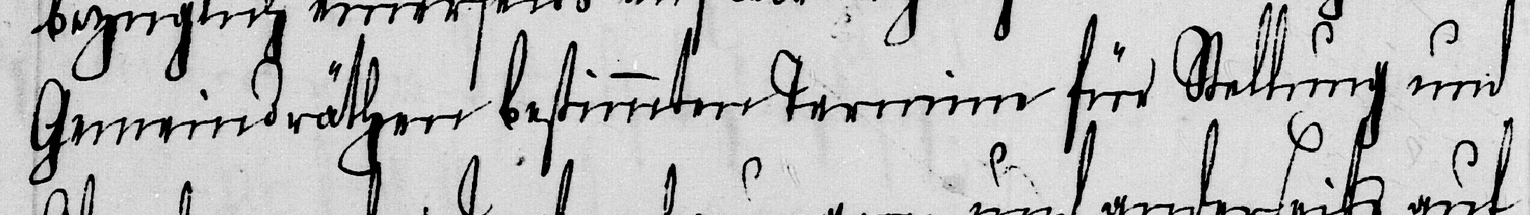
Gemeindräthen bestimmten Termine für Stellung und
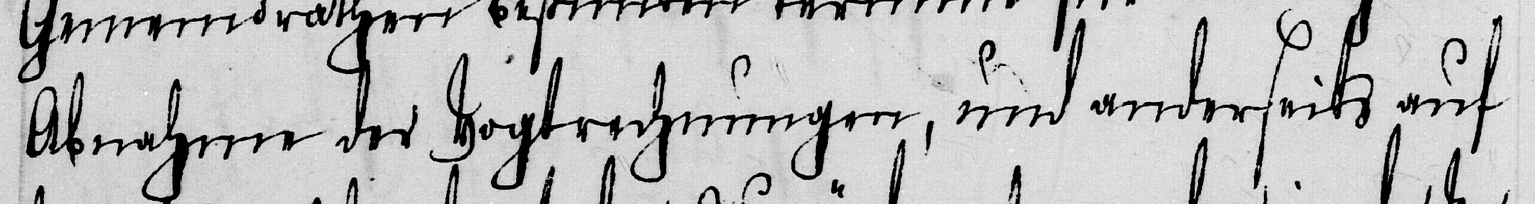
Abnahme der Vogtrechnungen, und andrerseits auf
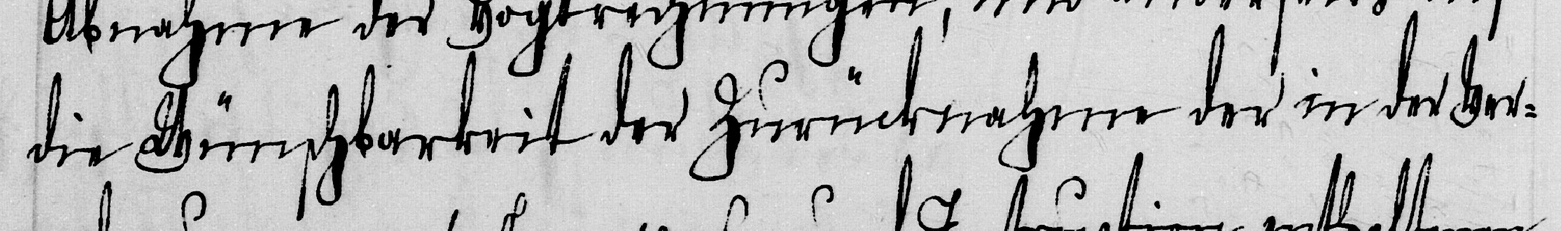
die Wünschbarkeit der Zurücknahme der in der Ver¬
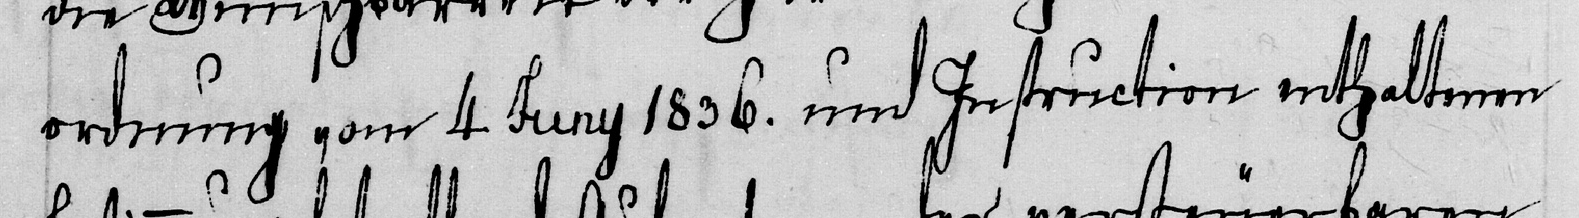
ordnung vom 4 Juny 1836. und Instruction enthaltenen
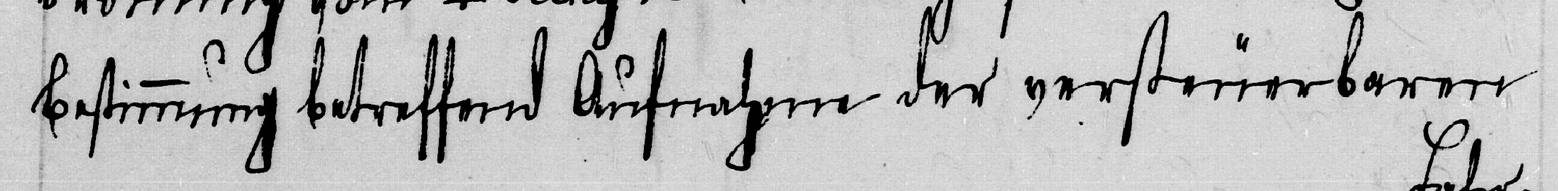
Bestimmung betreffend Aufnahme der versteuerbaren
